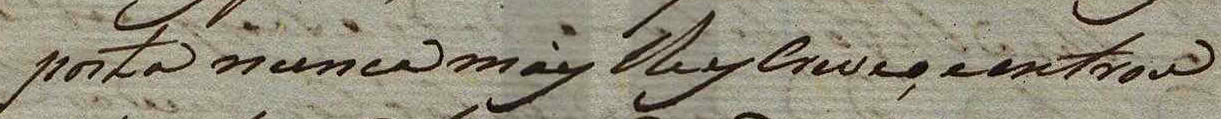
posta nunca mais lhe esCreveo, e entrou
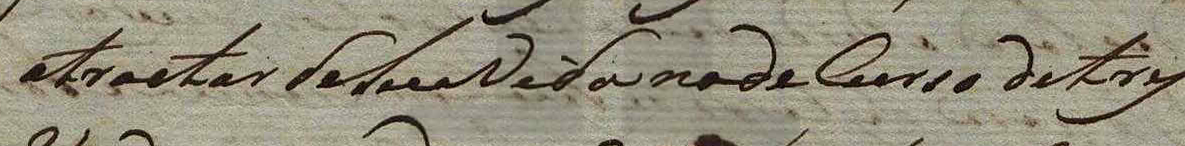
a tractar de Sua Vida no deCurso de tres
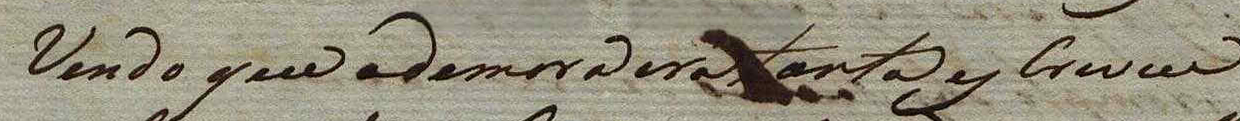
Vendo que a demora era tanta esCreveu
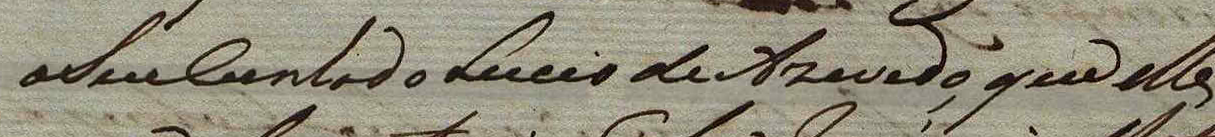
o Seu Cunhado Lucio de Azevedo, que elle
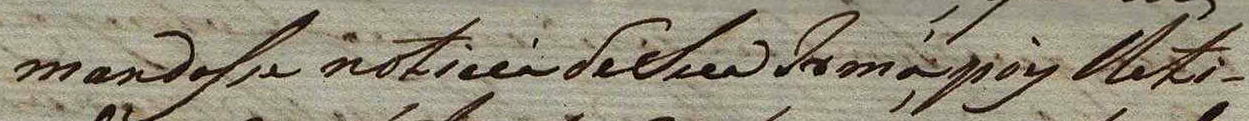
mandasse noticia de Sua Irmá, pois lhe ti
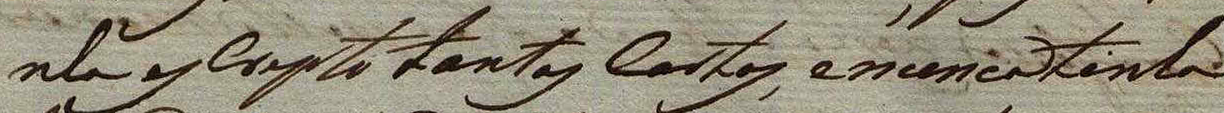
nha esCripto tantas Cartas, e nunca tinha
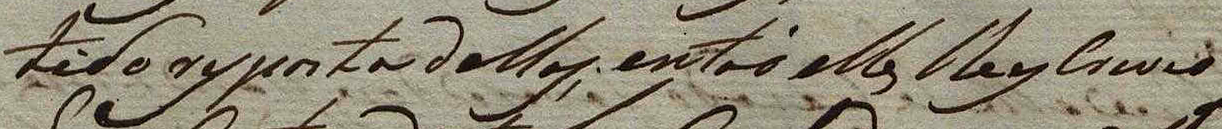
tido resposta dellas, entaõ elle lhe esCreveo
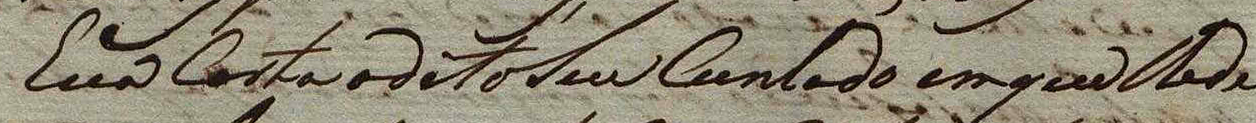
hua Carta o dito Seu Cunhado em que lhe de
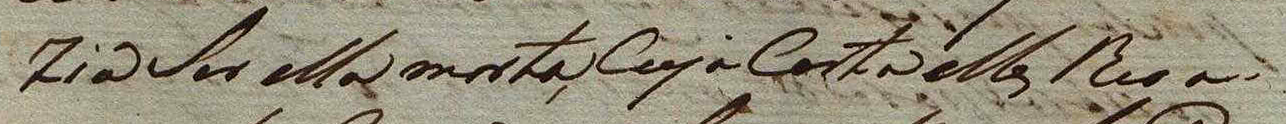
Zia ser ella morta, Cuja Carta elle Reo a
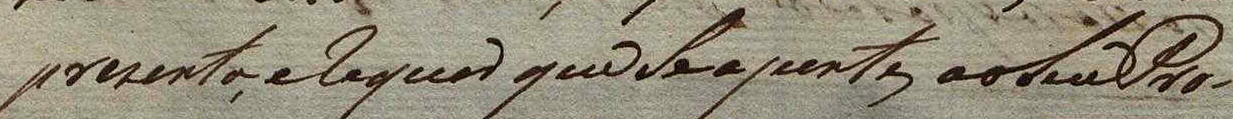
prezenta, e Requer que se ajunte ao Seu Pro
